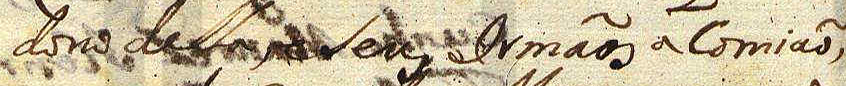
dono della, e seus Irmaõs a Comiaõ,
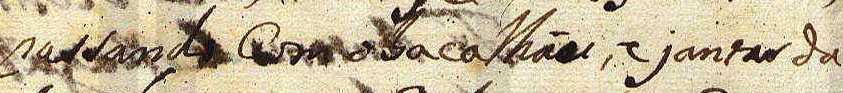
passando Com o bacalháu, e jantar da
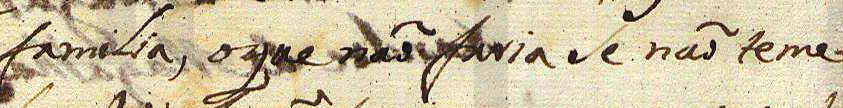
familia, o que naõ faria se naõ teme
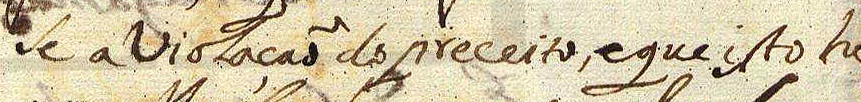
se a Violaçaõ do preceito, e que isto he
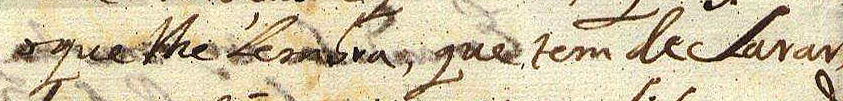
o que lhe lembra, que tem declarar,
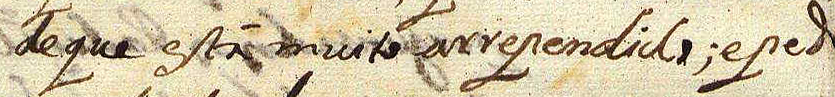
de que está muito arrependido; e ped
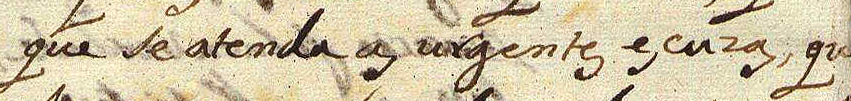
que se atenda as urgentes escuzas, qu
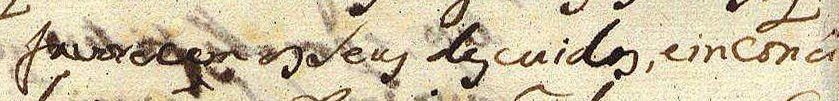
favorecem os seus descuidos, e inconci
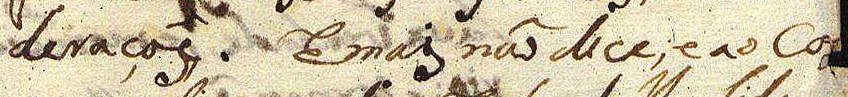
deraçoẽs. E mais naõ dice, e ao Cos
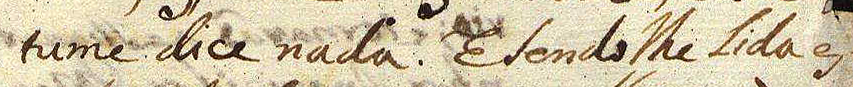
tume dice nada. E sendolhe lida es
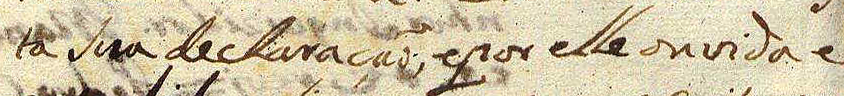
ta sua declaraçaõ, e por elle ouvida e
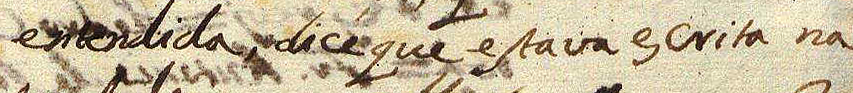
entendida, dice que estava escrita na
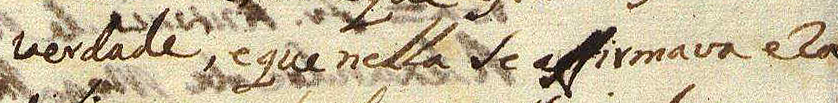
verdade, e que nella se affirmava e Ra
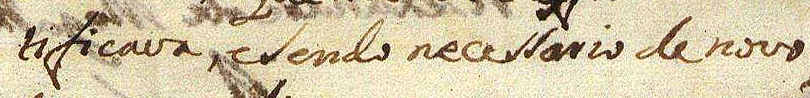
tificava, e sendo necessario de novo
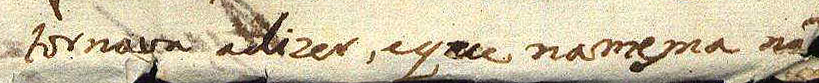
tornava a dizer, e que na mesma não
